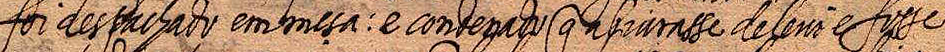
foi despachado em mesa: e condenado q̄ abiurasse de leui e fosse
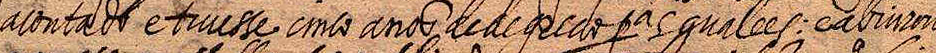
açoutado e tiuesse cinco anos̄ de degredo ꝑa E gualees: e abiurou
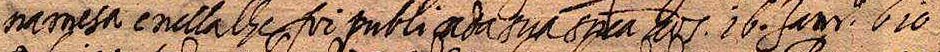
na mesa e nella lhe foi publicada sua sn̄ça aos 16. Janr.o 610.
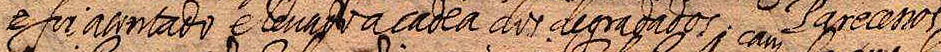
e foi açoutado e leuado a cadea dos degradados. Parecenos
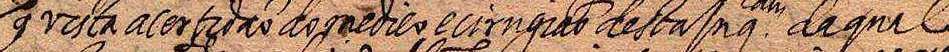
q̄ vista a certidaõ do medico e cirugiaõ desta Jnq.çam da qual
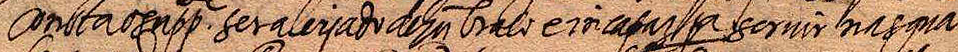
consta o supp.te ser aleijado de hū braço e incapaz ꝑa seruir nas gua
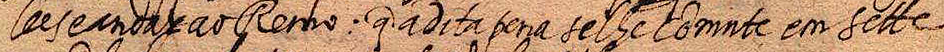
lees e andar ao Remo. q̄. a dita pena se lhe cōmute em sette
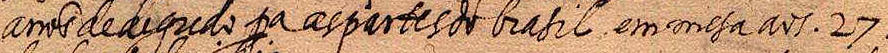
anos̄ de degredo ꝑa as partes do brasil em mesa aos. 27.
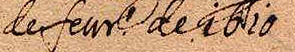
de feuer.o de 1610.
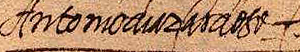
Antonio diaz Cardoso
